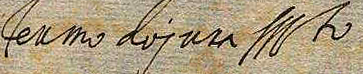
termo do juraMto
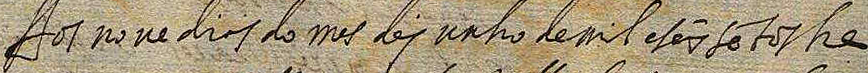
Aos noue dias do mes de junho de mil e seissētos he
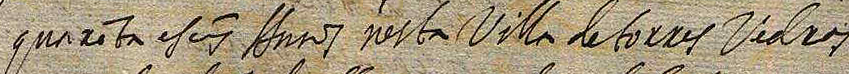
quarēta e seis Annos nesta villa de torres Vedras
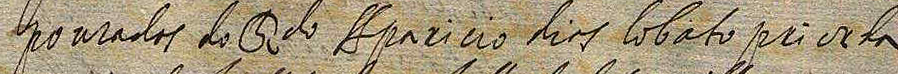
pouzadas do Rdo Aparicio dias lobato prior da
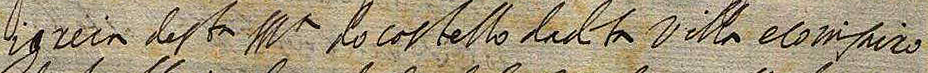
igreia de sta Ma do castello da dita Villa e comisairo
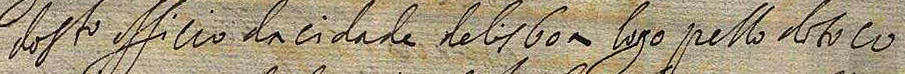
do sto officio da cidade de lisboa logo pello dito co
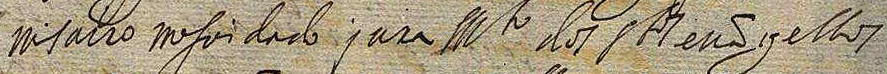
misairo me foi dado juraMto dos stos euāgelhos
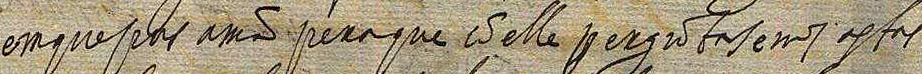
em que pos a maõ pera que cō elle pergūtasemos as tas
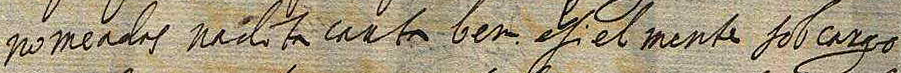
nomeadas na dita carta bem e fielmente sob cargo
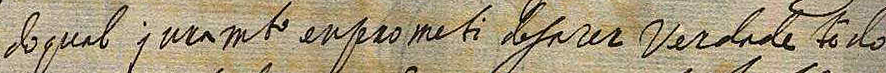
do qual juramto eu prometi de fazer Verdade tēdo
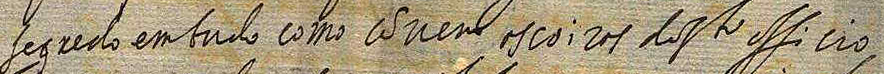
segredo em tudo como cōuem as coizas do sto officio
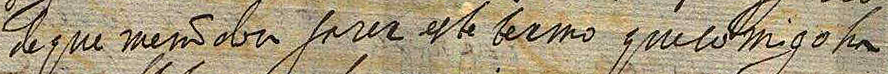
de que me mādou fazer este termo que comigo ha
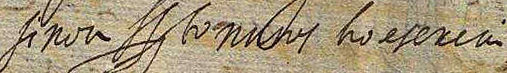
sinou Agto nunes ho escreui
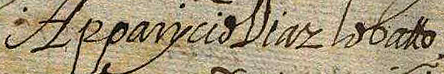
Apparycio Diaz lobatto
